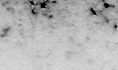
die
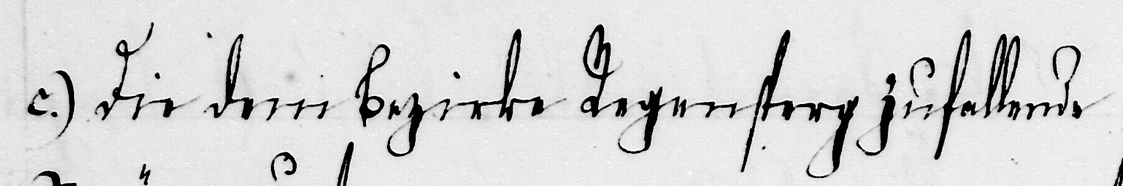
c.) Die dem Bezirke Regensperg zufallende
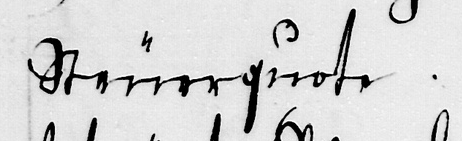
Steuerquote
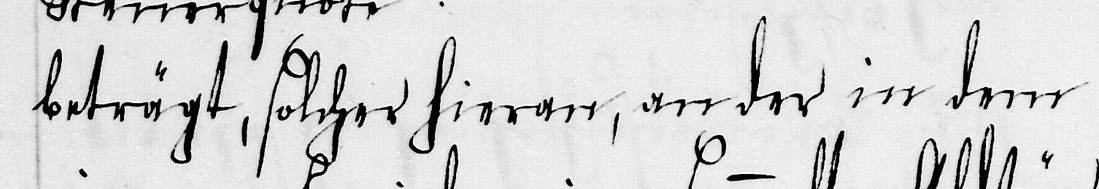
beträgt, solcher hieran, an der in dem
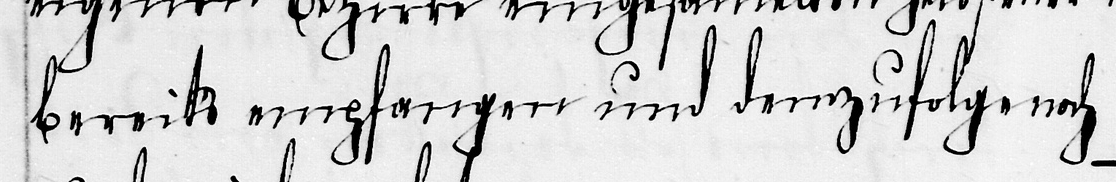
bereits empfangen und demzufolge noch
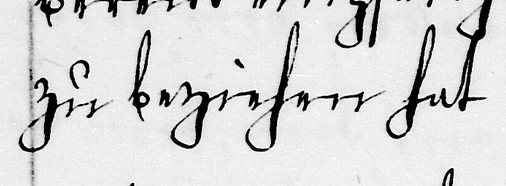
zu beziehen hat.
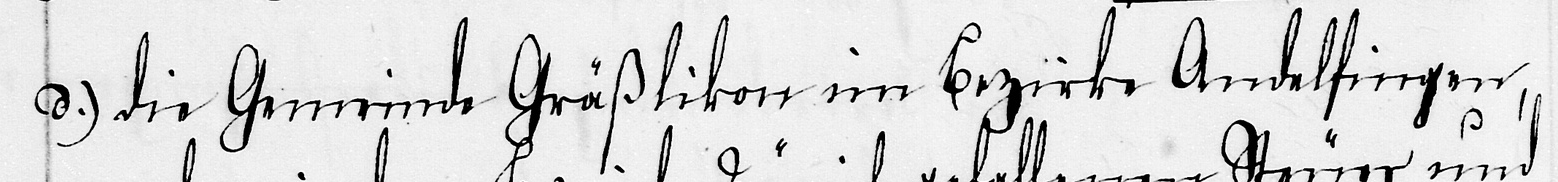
d.) die Gemeinde Gräßlikon im Bezirke Andelfingen,
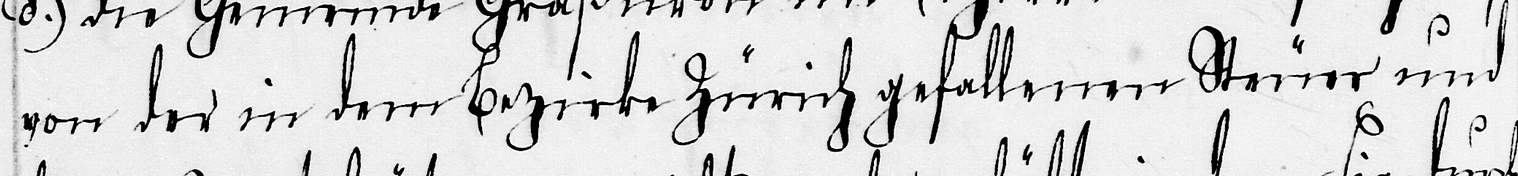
von der in dem Bezirke Zürich gefallenen Steuer und
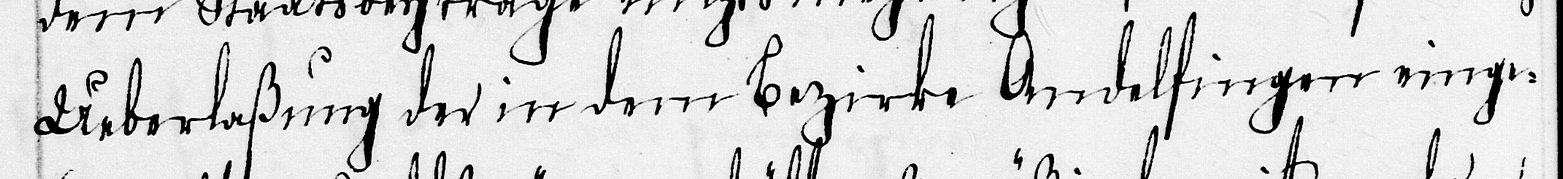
Ueberlaßung der in dem Bezirke Andelfingen einge¬
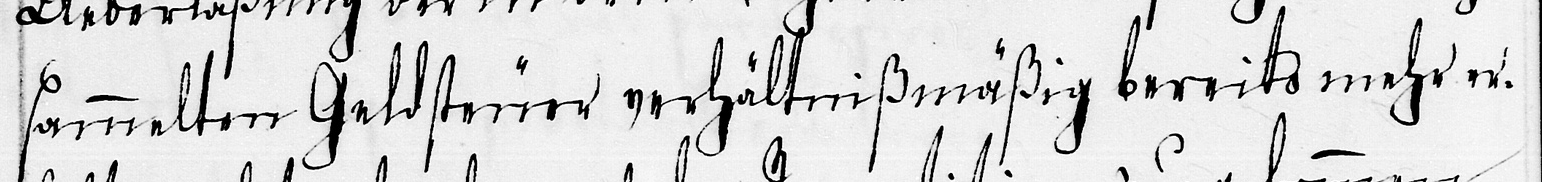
sammelten Geldsteuer verhältnißmäßig bereits mehr er¬
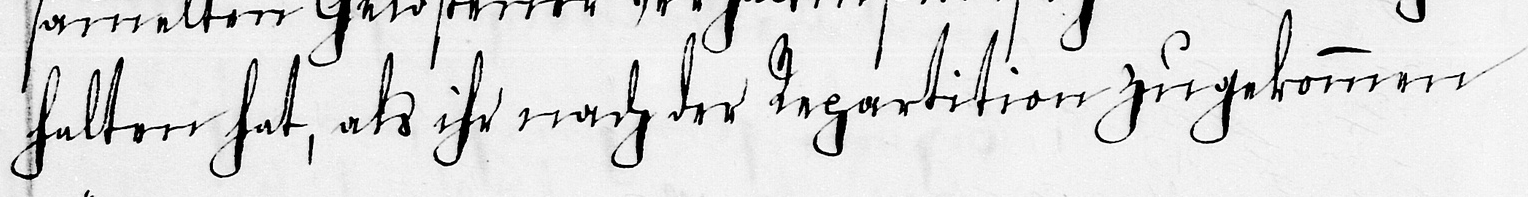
halten hat, als ihr nach der Repartition zugekommen
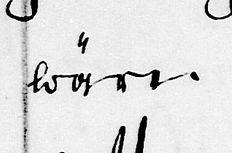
wäre.
